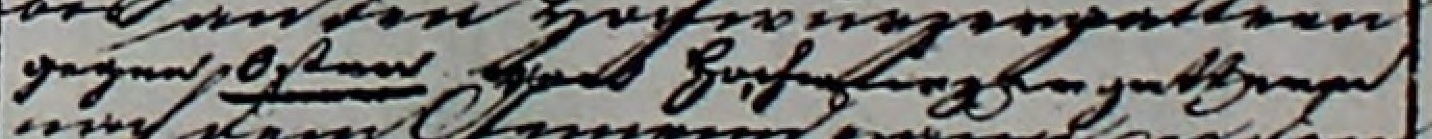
gegen Osten ??? Hochwurzergattern
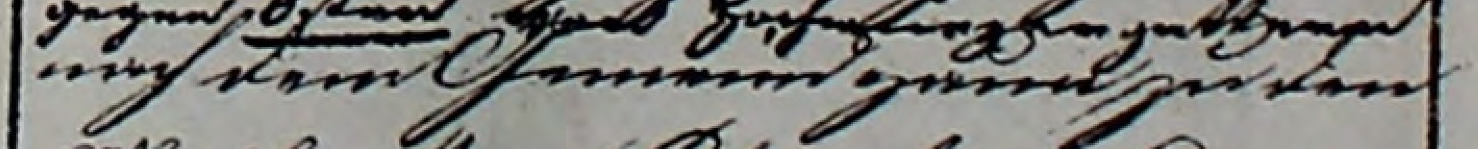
nach dem Gemeindezaun zu den
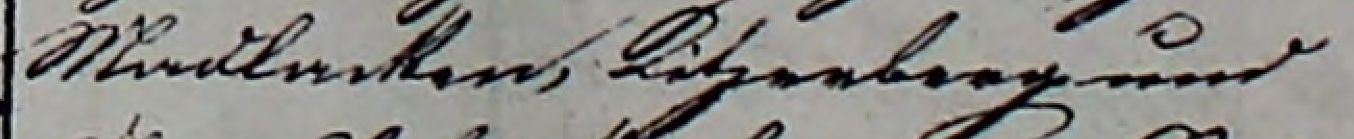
Madlaken, Kitzerberg und
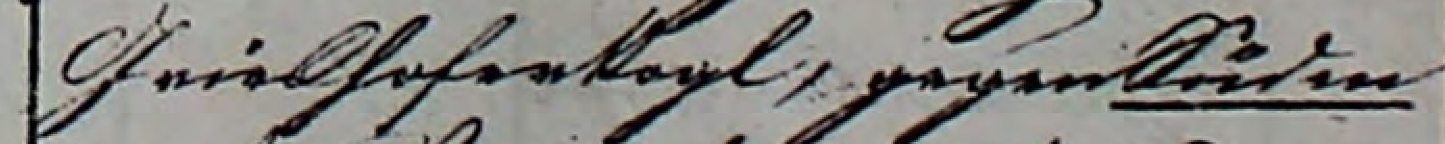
Grieshoferkogl, gegen Süden
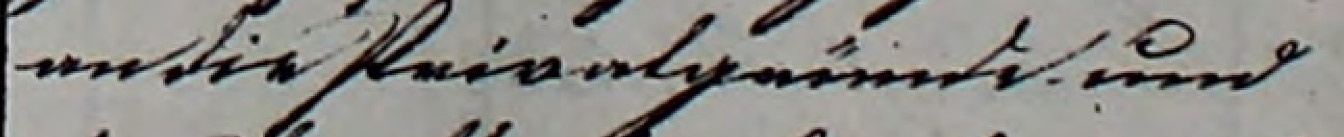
an die Privatgründe und
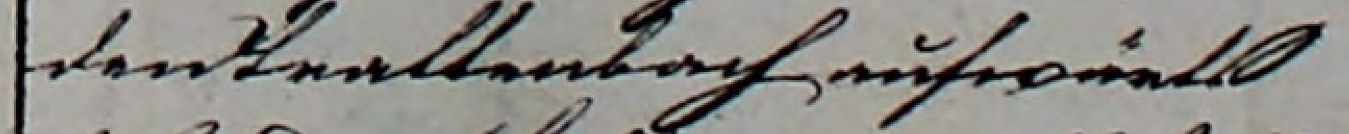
den Trattenbach aufwärts
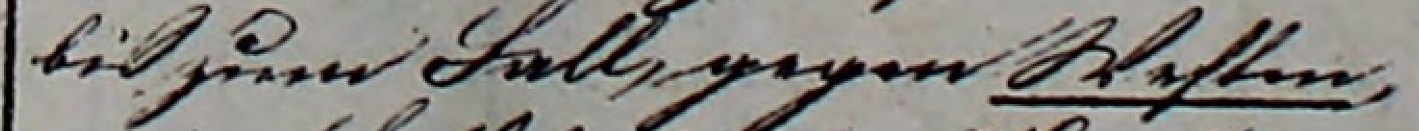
bis zum Fall, gegen Westen,
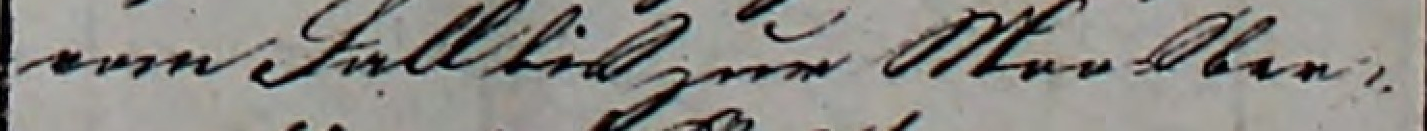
vom Fall bis zur Marsber„
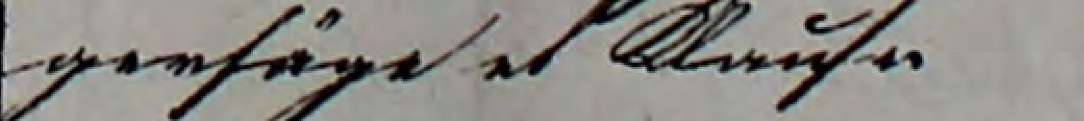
gersäge et Klause
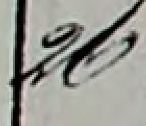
26
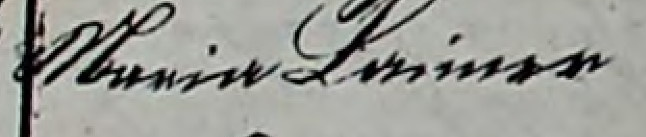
Maria Laimer
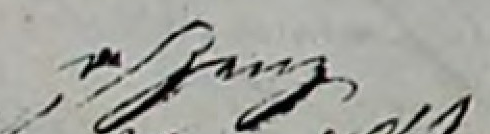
v. Zenz
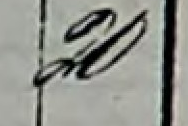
20
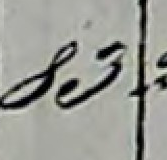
83
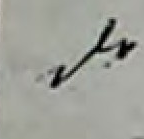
do
